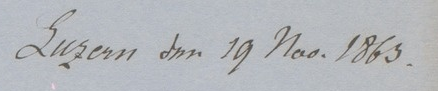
Luzern den 19 Nov. 1863.
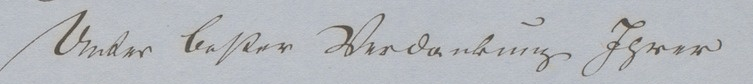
Unter bester Verdankung Ihrer
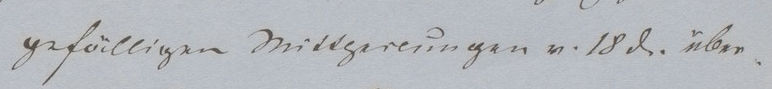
gefälligen Mittheilungen v. 18 d. über-
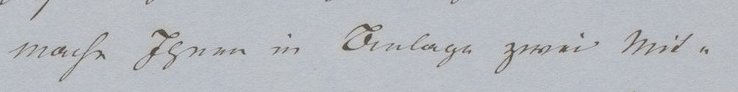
mache Ihnen in Anlage zwei Mit-
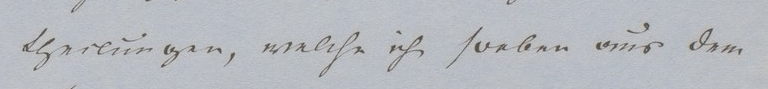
theilungen, welche ich soeben aus dem
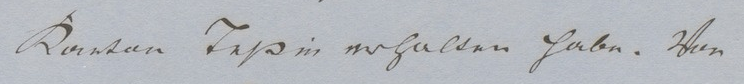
Kanton Teßin erhalten habe. Von
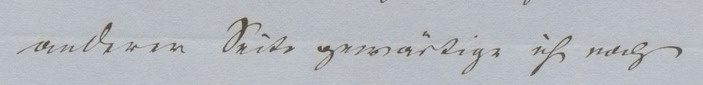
anderer Seite gewärtige ich noch
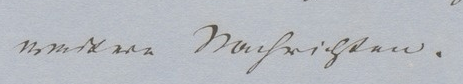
weitere Nachrichten.
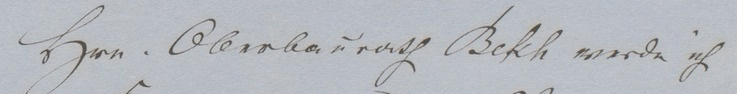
Hrn. Oberbaurath Bekh werde ich
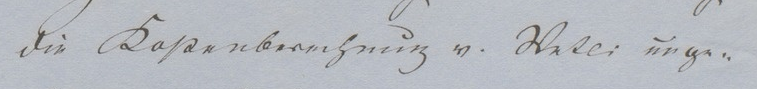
die Kostenberechnung v. Wetli unge-
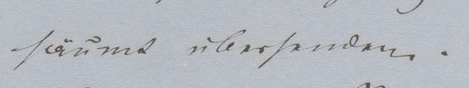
säumt übersenden.
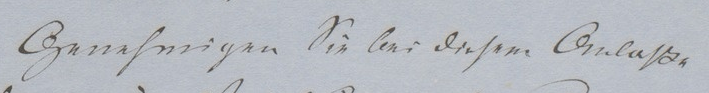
Genehmigen Sie bei diesem Anlaße
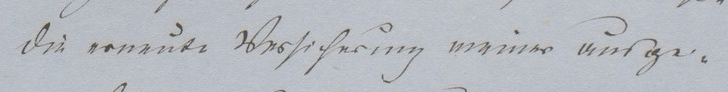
die erneute Versicherung meiner ausge-
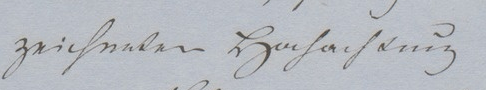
zeichneten Hochachtung
